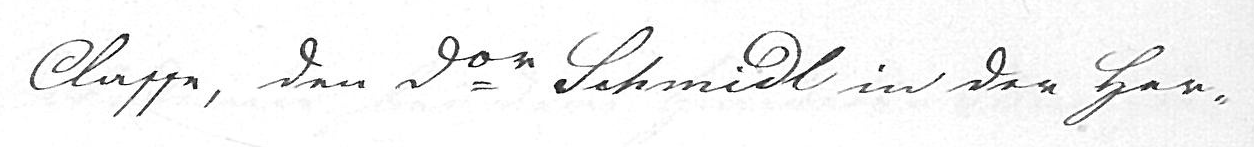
Classe, den Dor Schmidl in der Her-
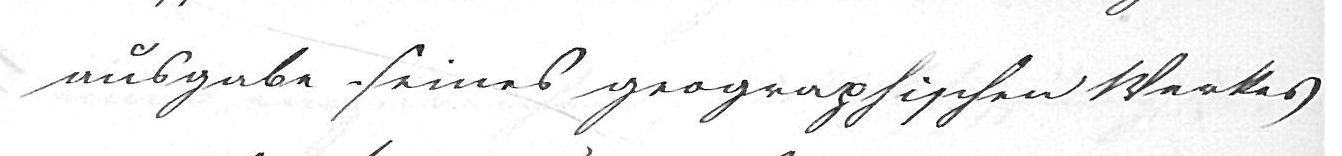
ausgabe seines geographischen Werkes
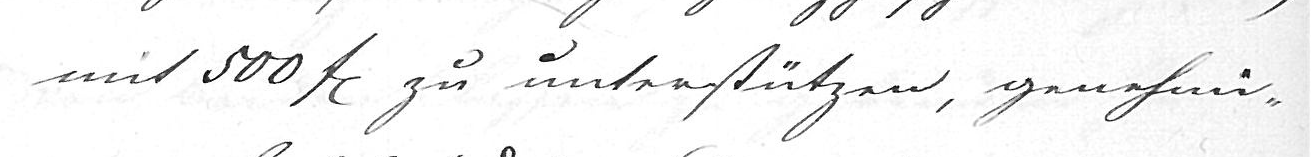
mit 500 fl zu unterstützen, genehmi-
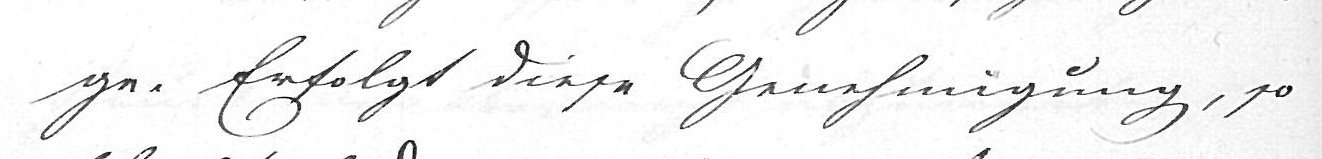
gen. Erfolgt diese Genehmigung
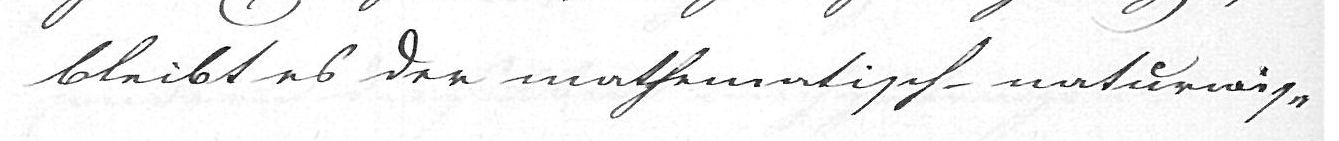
bleibt es der mathematisch-naturwis-
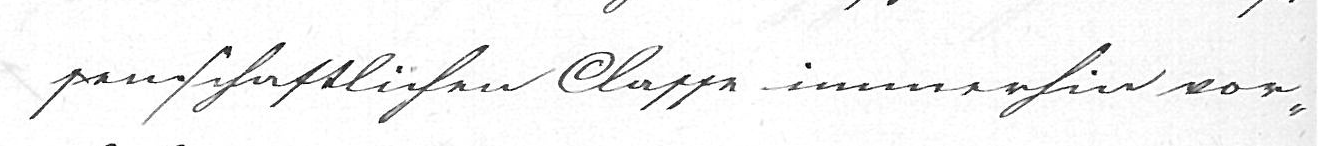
senschaftlichen Classe immerhin vor-
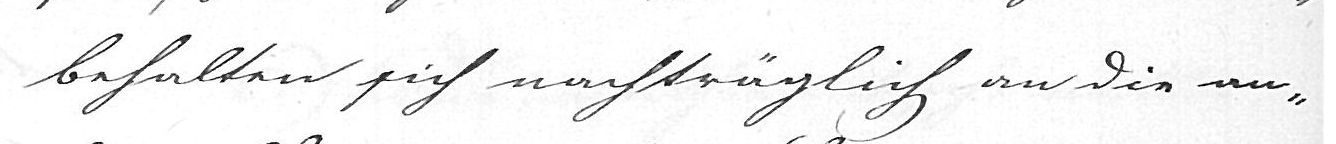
behalten sich nachträglich an die an-
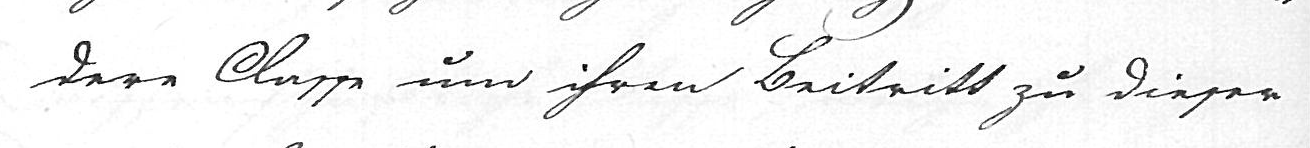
dere Classe um ihren Beitritt zu dieser
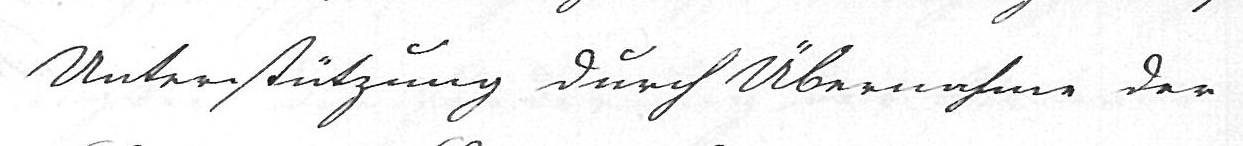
Unterstützung durch Übernahme der
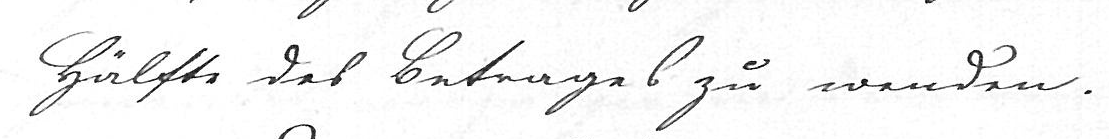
Hälfte des Betrages zu wenden.
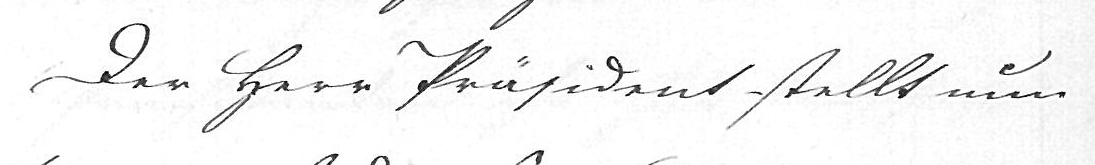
Der Herr Präsident stellt nun
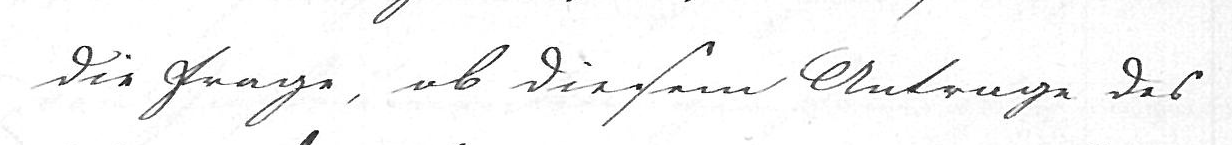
die Frage, ob diesem Antrage des
